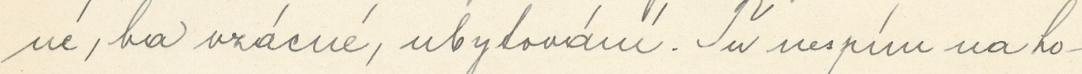né, ba vzácné ubytování. Tu nespím na ho-
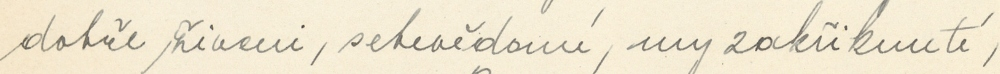dobře živeni, sebevědomí, my zakřiknutí,
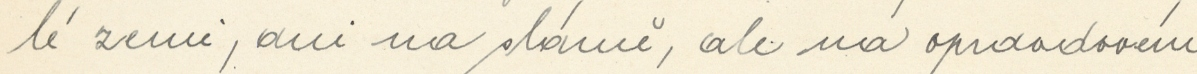lé zemi, ani na slámě, ale na opravdovém
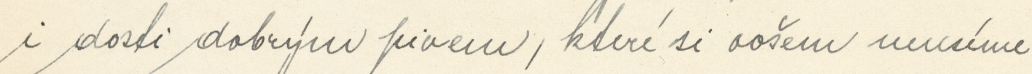i dosti dobrým pivem, které si ovšem musíme
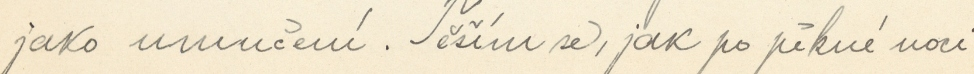jako umučení. Těším se, jak po pěkné noci
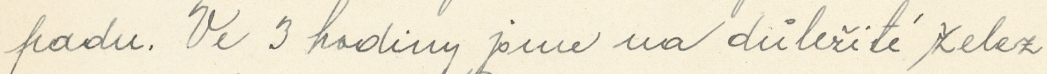padu. Ve 3 hodiny jsme na důležité želez-
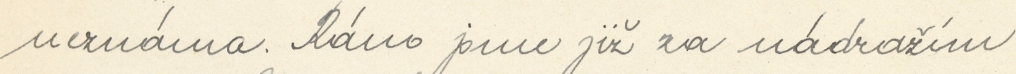neznáma. Ráno jsme již za nádražím
